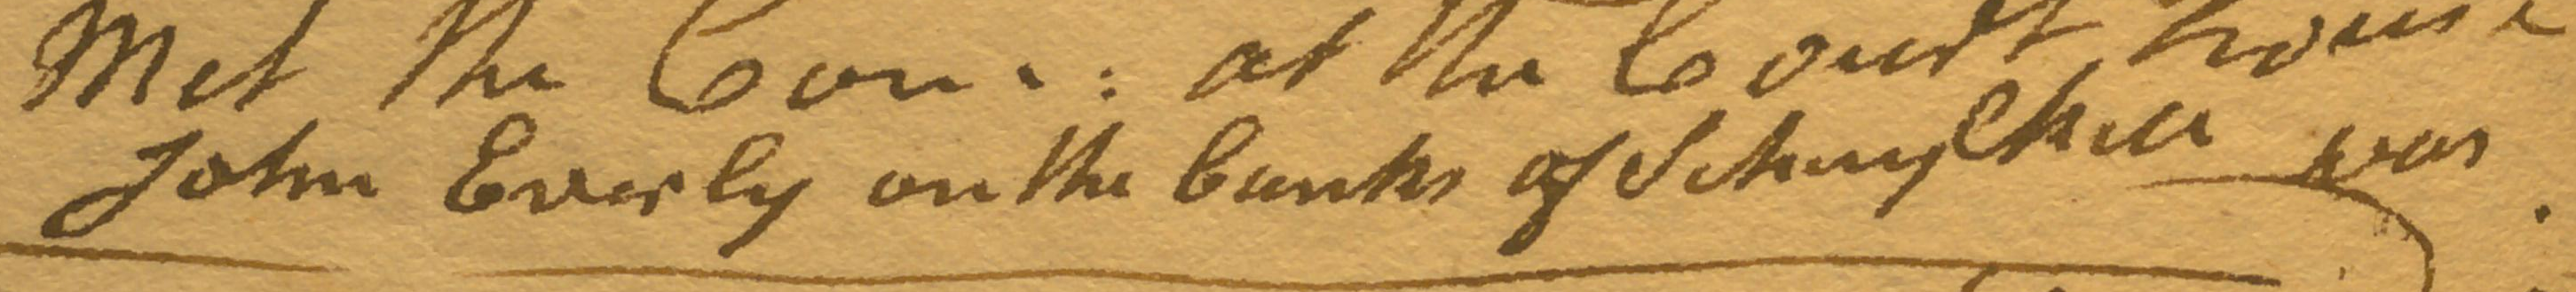John Everly on the banks of Schuylkill was
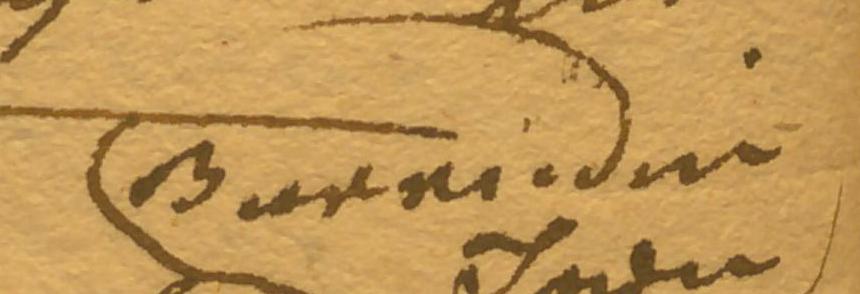Burned in
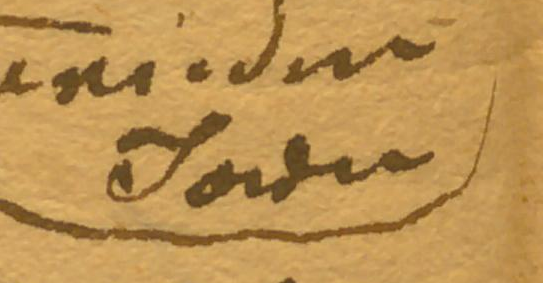Town
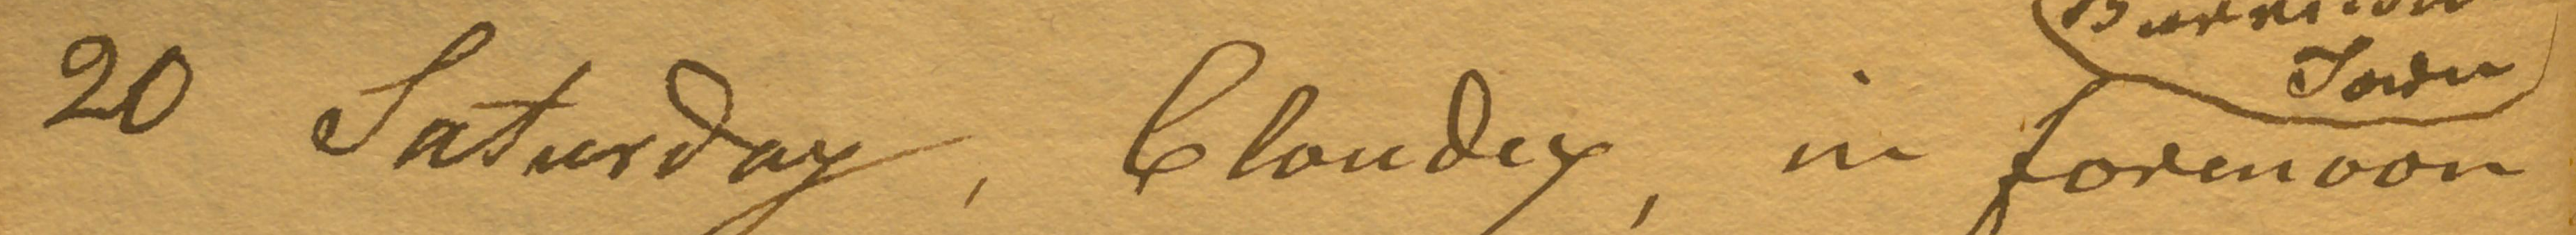20 Saturday. Cloudey, in forenoon
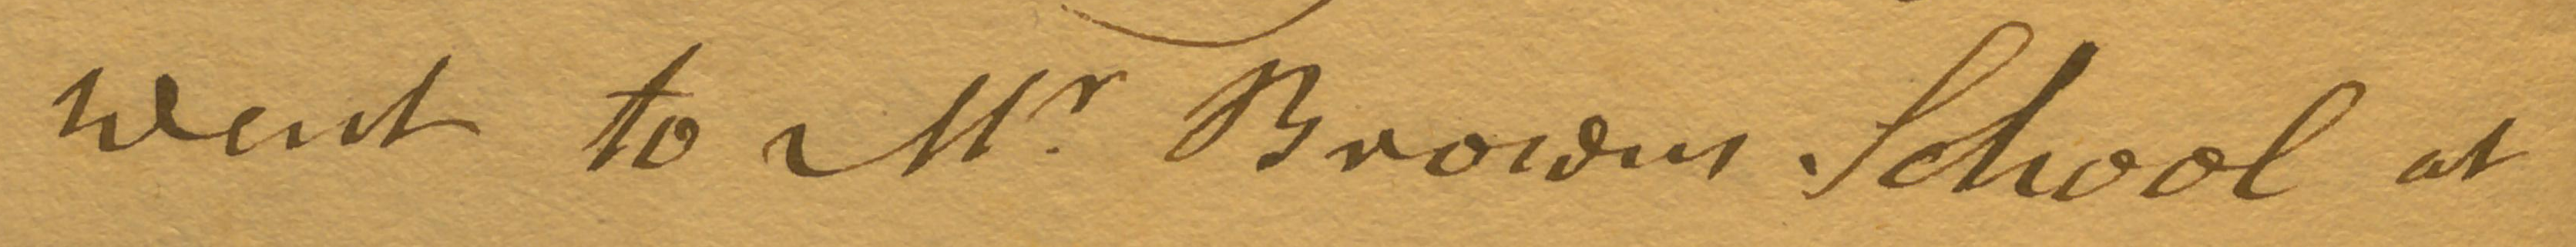went to M^r. Browns School at
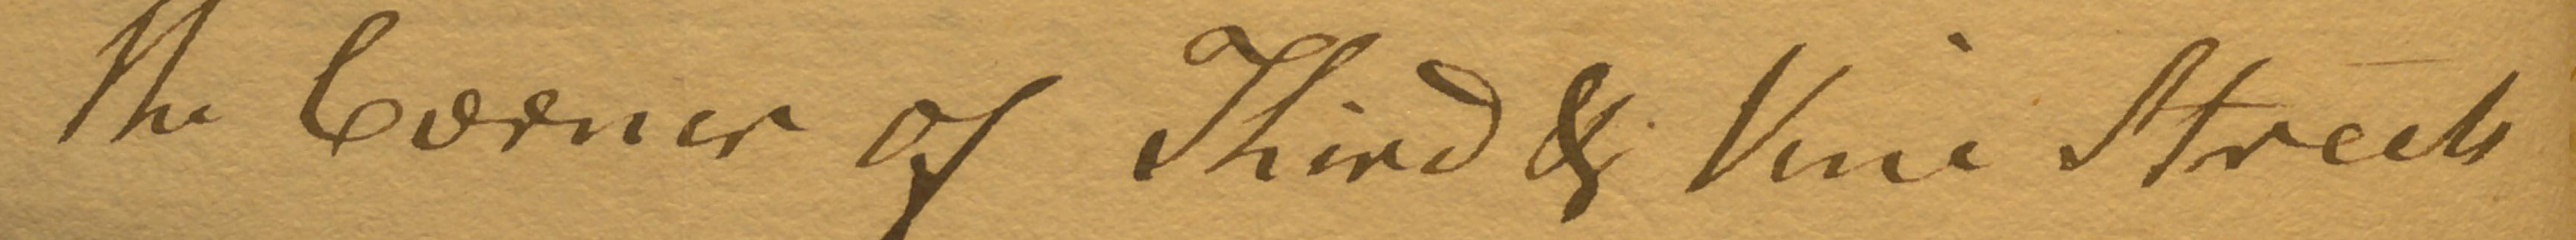the Corner of Third & Vine Streets
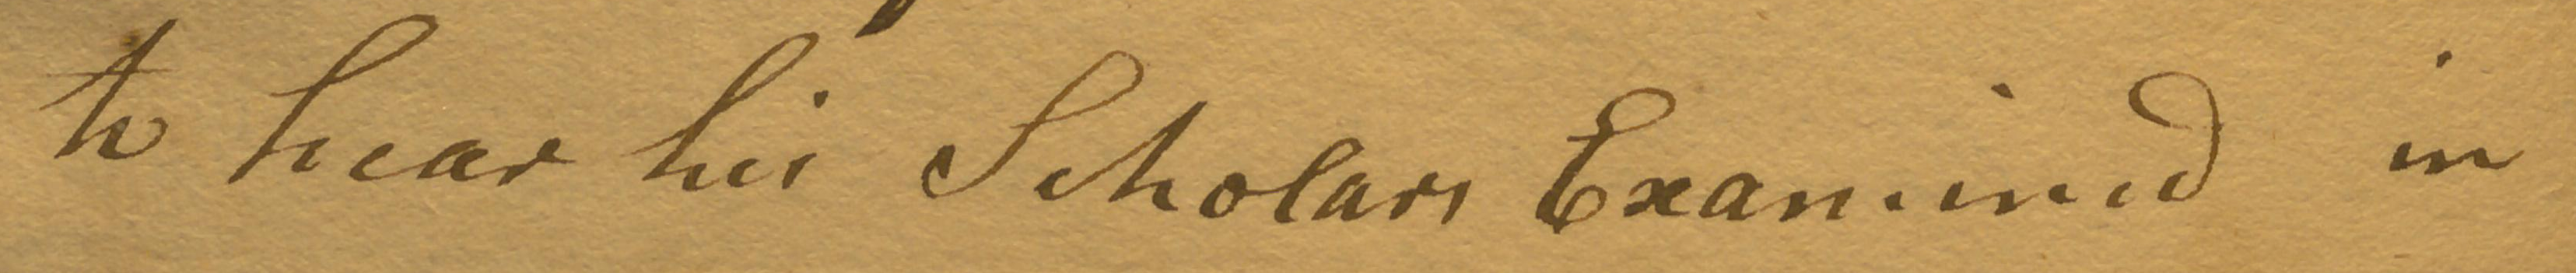to hear his Scholars Examined in
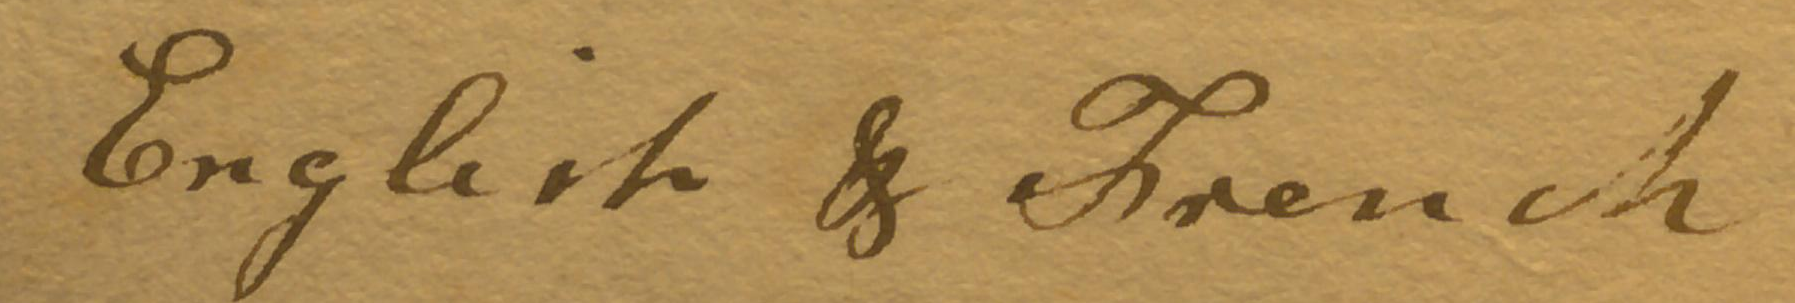English & French
